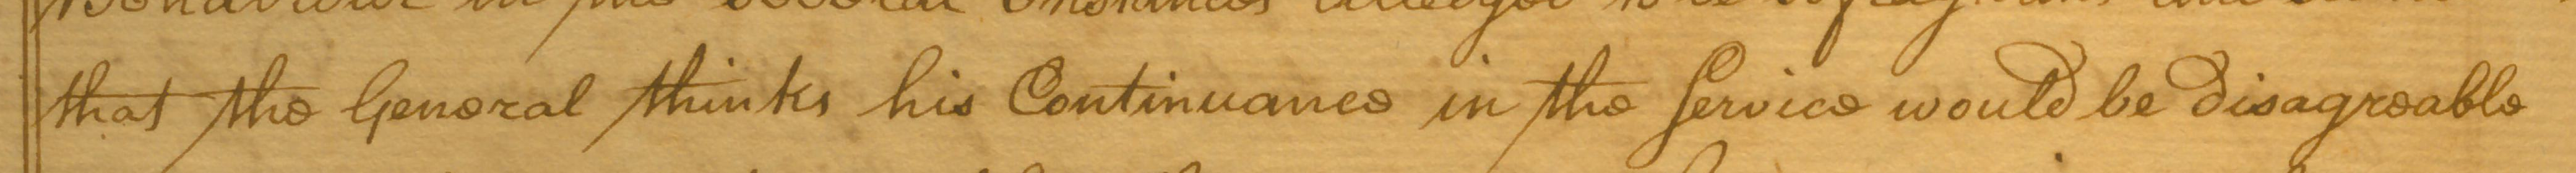that the General thinks his Continuance in the service would be disagreable
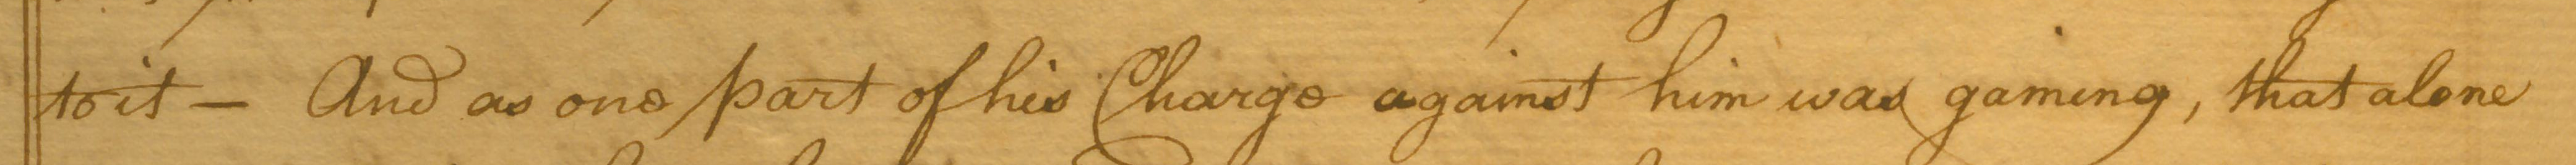to it- And as one part of his Charge against him was gaming, that alone
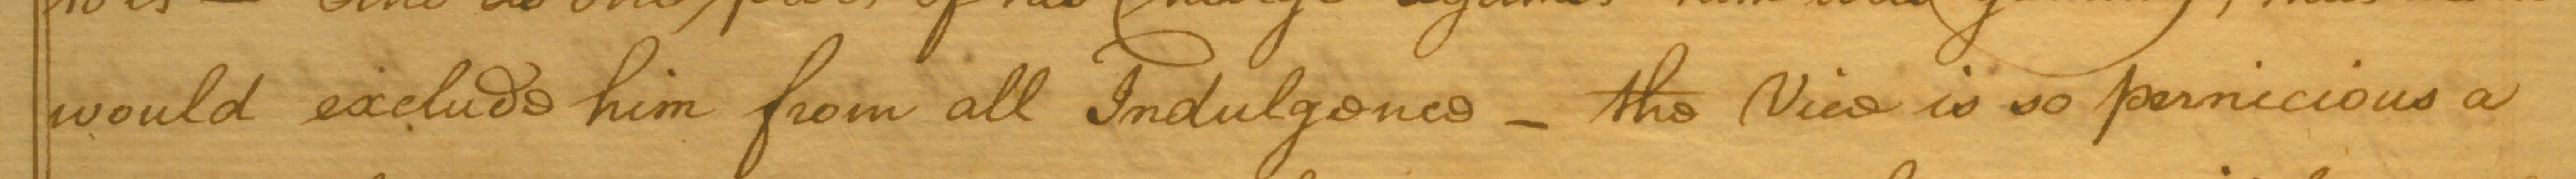would exclude him from all Indulgence- the Vice is so pernicious a
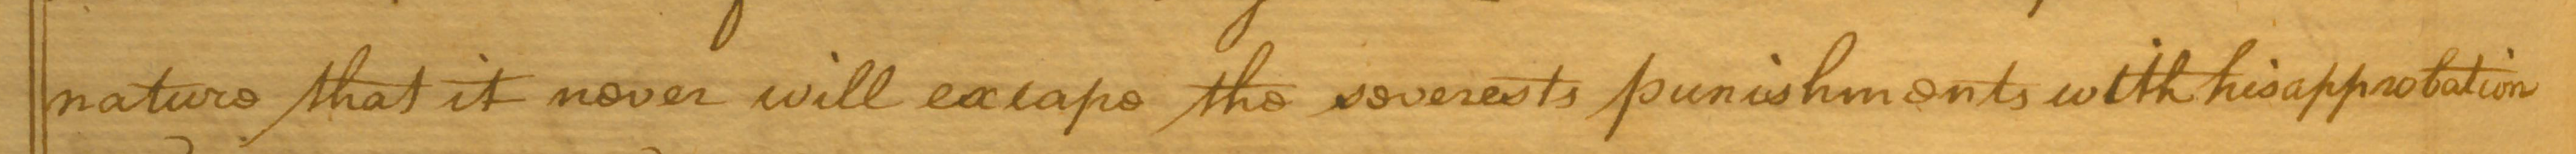nature that it never will excape the severests punishments with his approbation
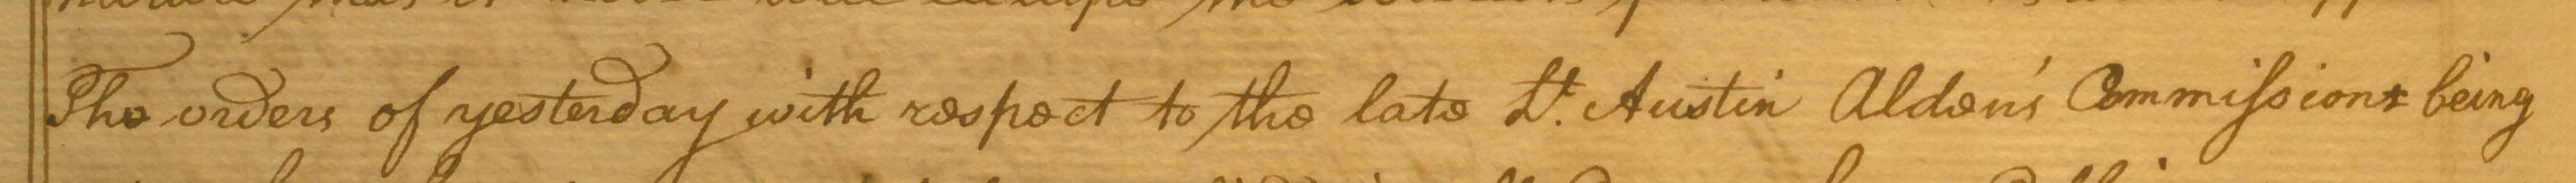The orders of yesterday with respect to the late L^t. Austin Alden's Commissions being
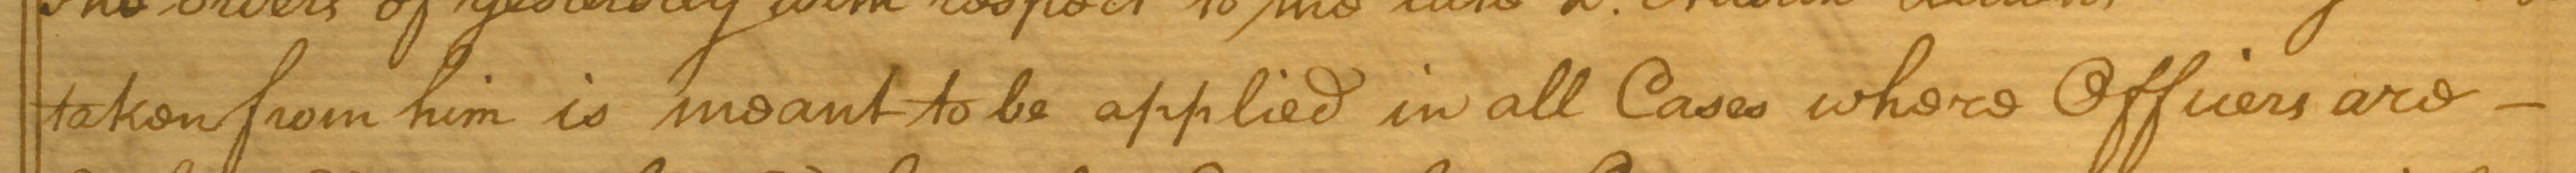taken from him is meant to be applied in all Cases where Officers are-
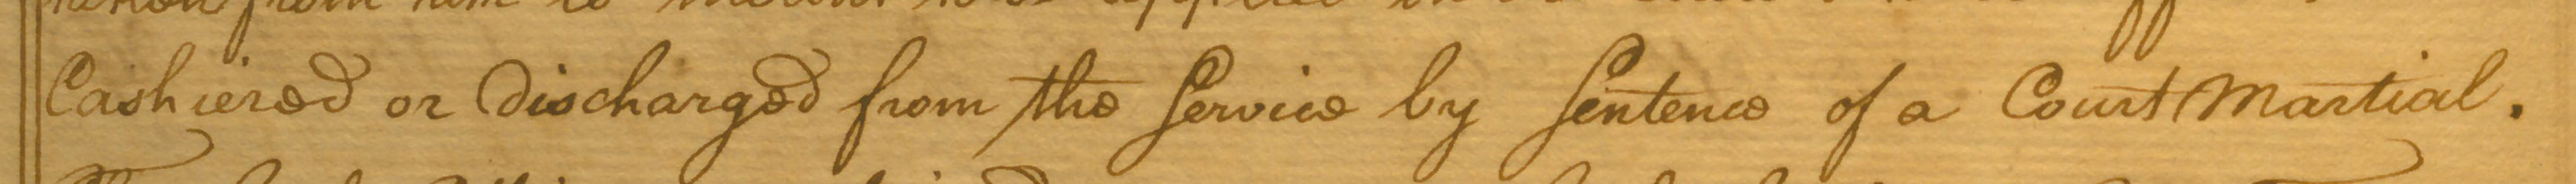Cashiered or discharged from the service by sentence of a Court Martial.
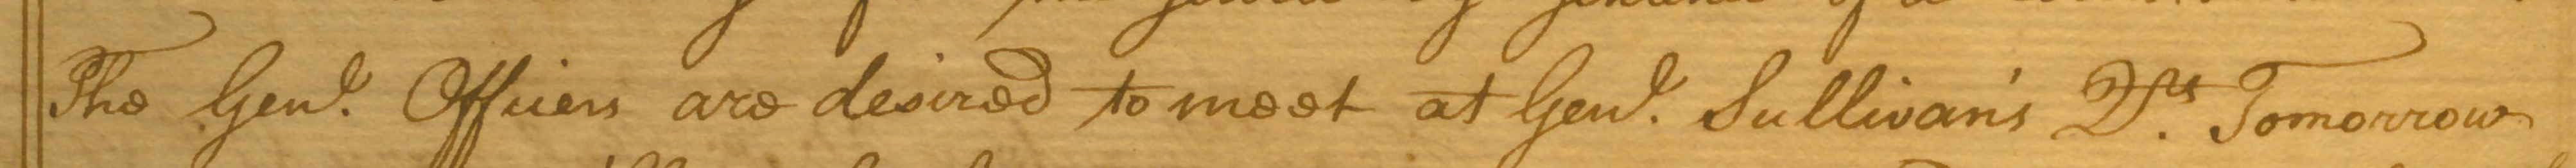The Gen^l. Officers are desired to meet at Gen^l. Sullivans Q^rs. Tomorrow
